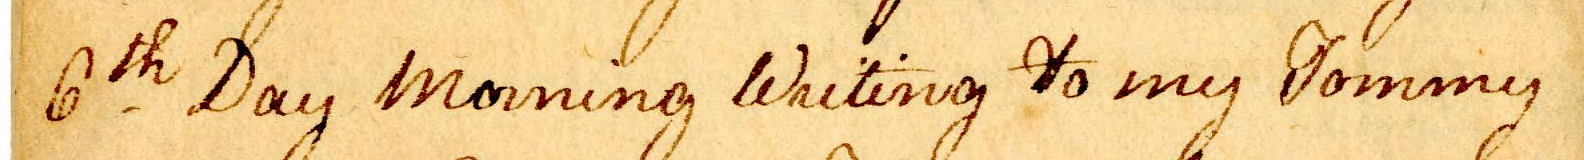6^th Day Morning Writing to my Tommy
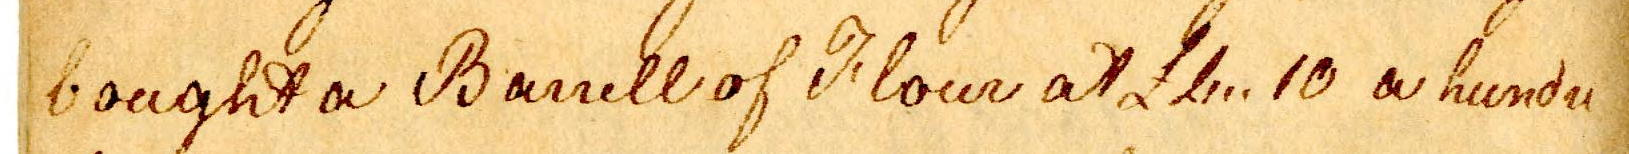bought a Barrell of Flour at £1..10 a hundre
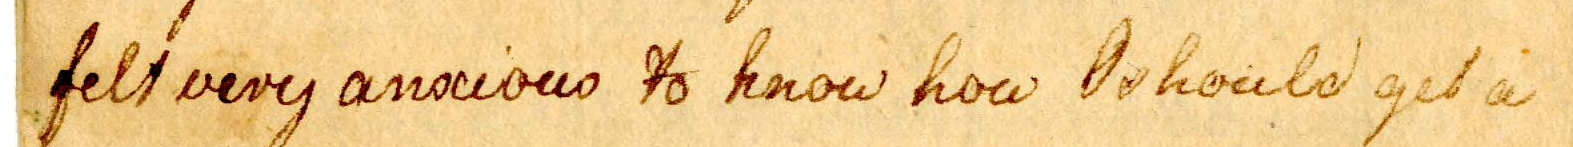felt very anxious to know how I should get a
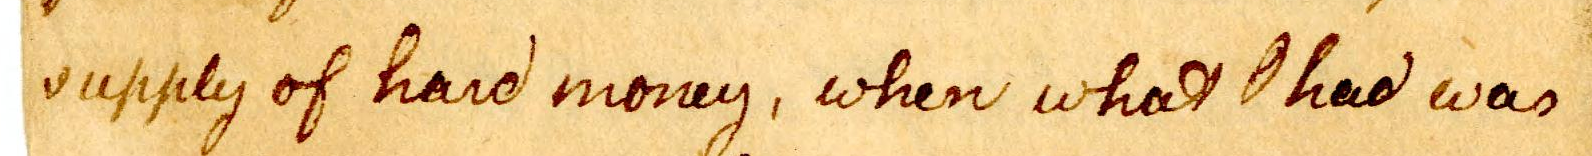supply of hard money, when what I had was
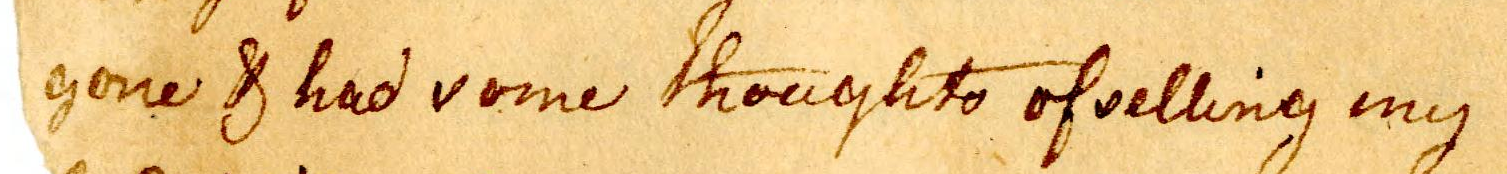gone & had some thoughts of selling my
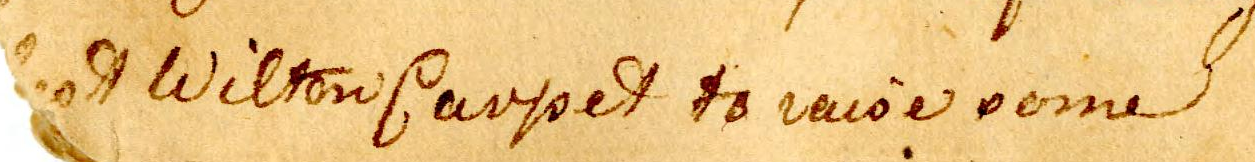st Wilton Carpet to raise some
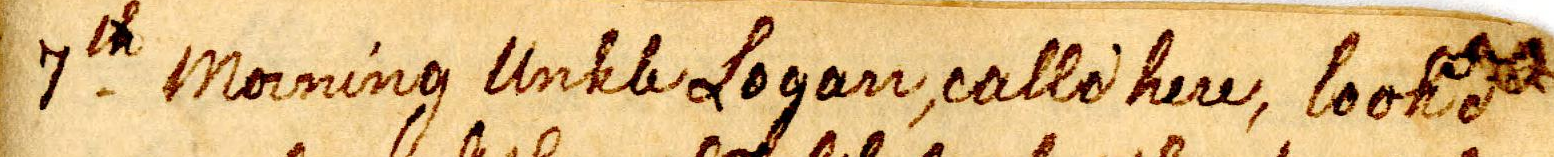7^th morning Unkle Logan calld here, lookd
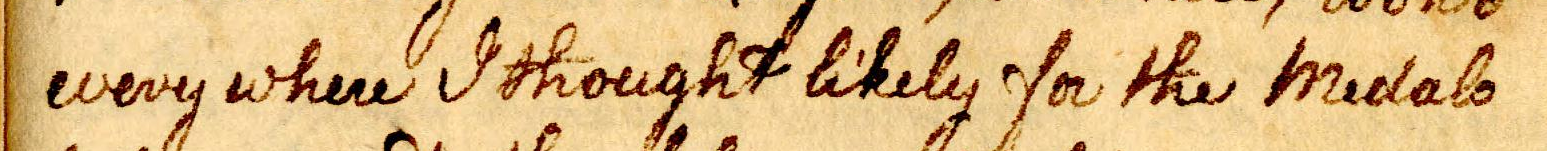every where I thought likely for the Medals
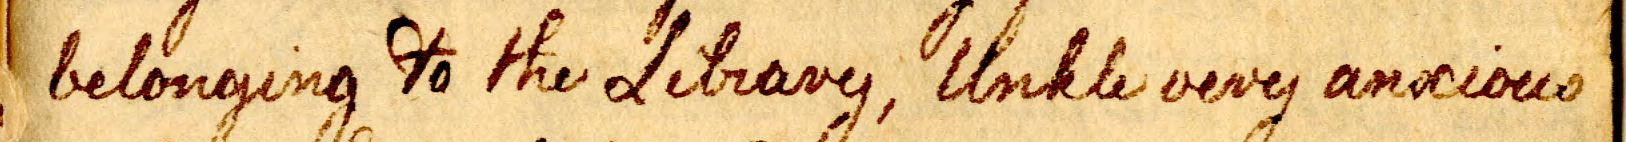belonging to the Library, Unkle very anxious
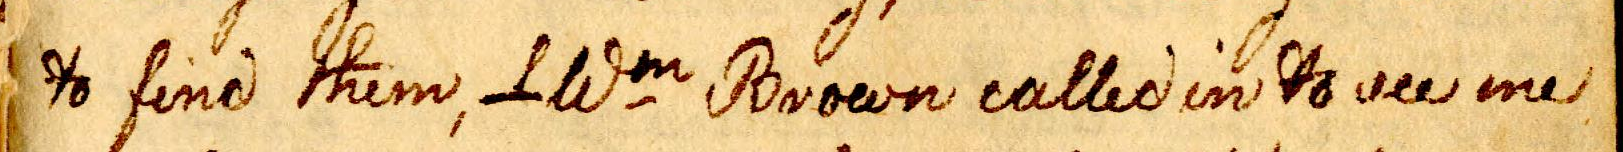to find them,[-] W^m Brown called in to see me
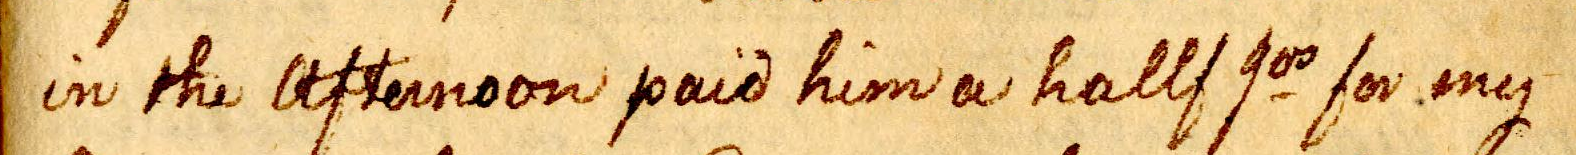in the Afternoon paid him a hallf [___] for my
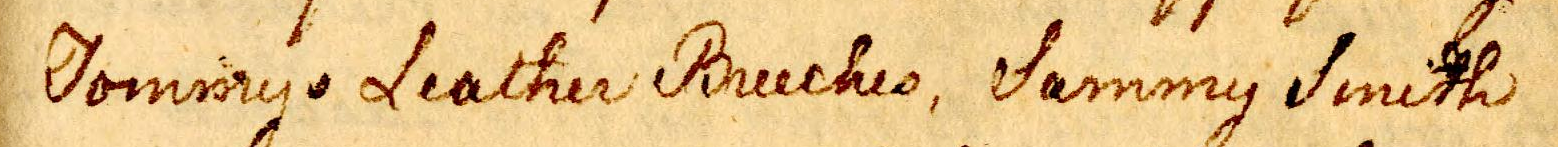Tommys Leather Breeches, Sammy Smith
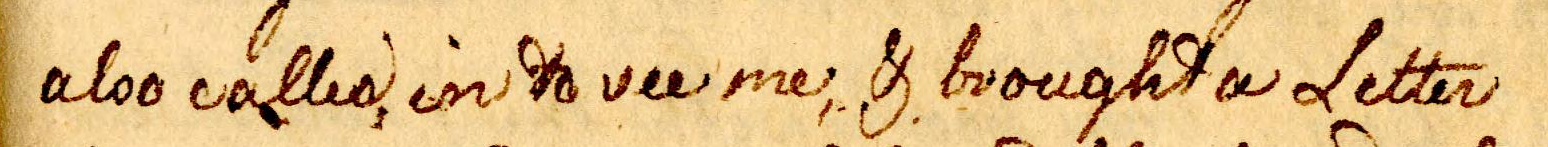also called, in to see me, & brought a Letter
